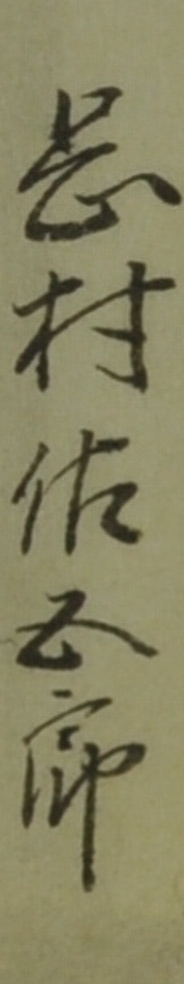岡村佐五郎
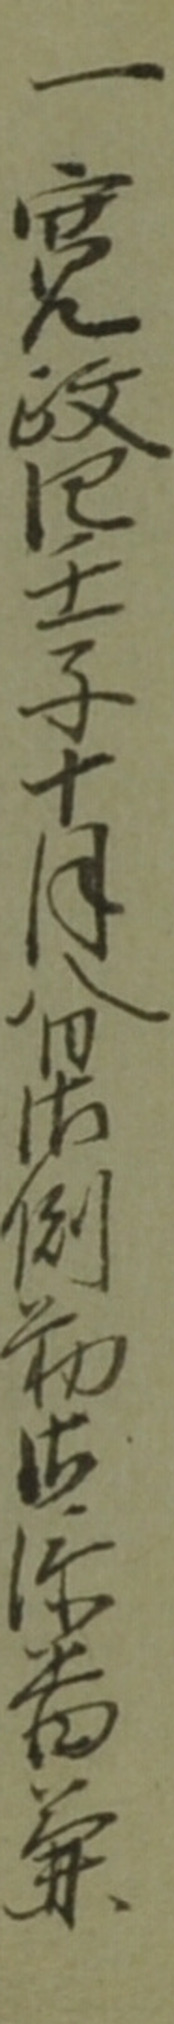一寛政四壬子十月八日御側勤御添番兼
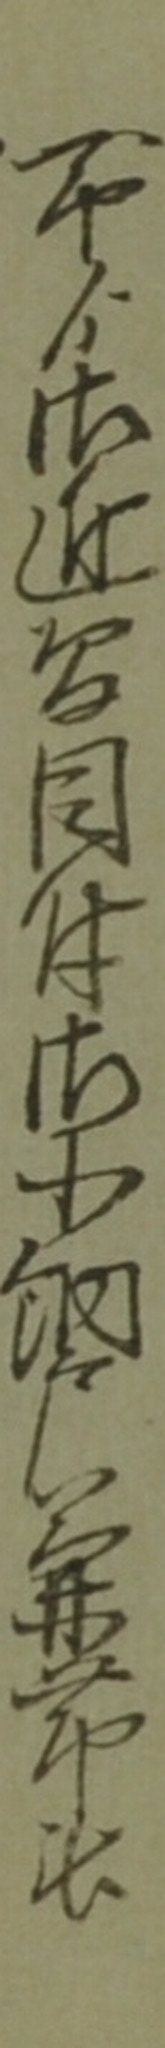帯ゟ御近習目付御小納戸兼帯被
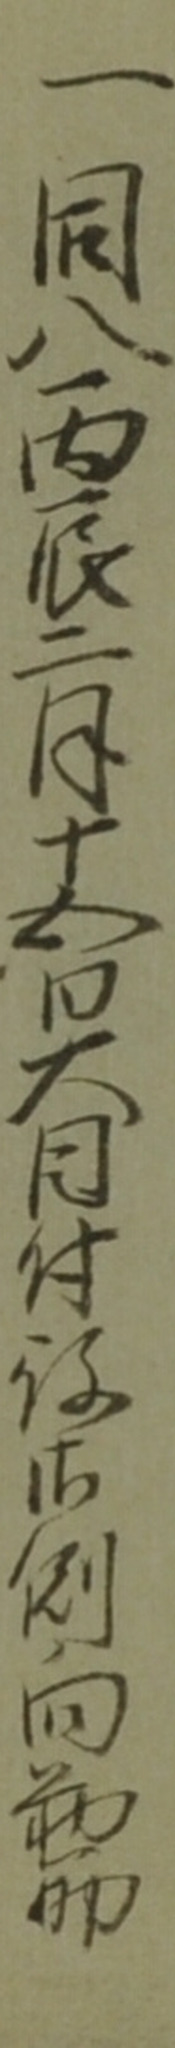一同八丙辰三月十五日大目付役御側向勤筋
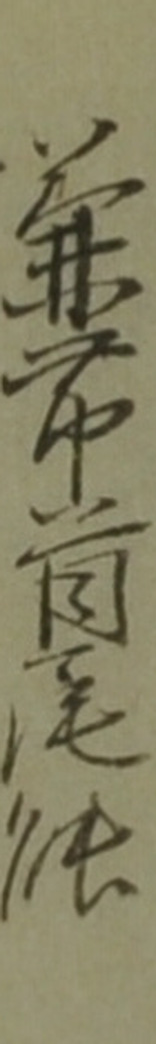兼帯首尾能
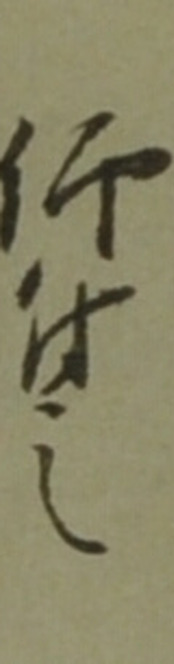仰付之
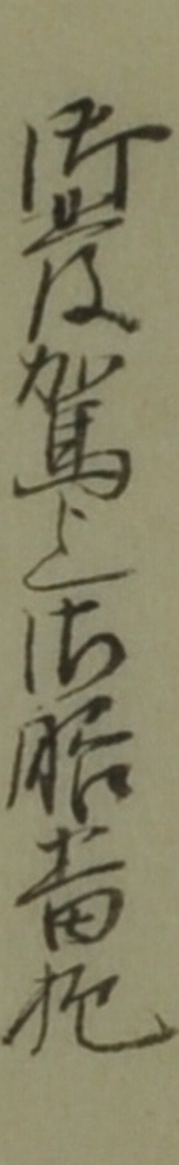御発駕上御膳番抱
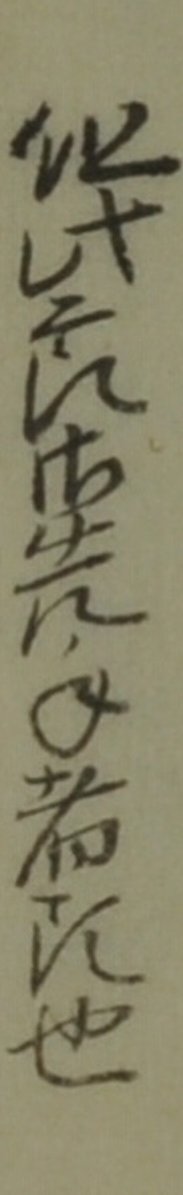但此節御先手物頭也
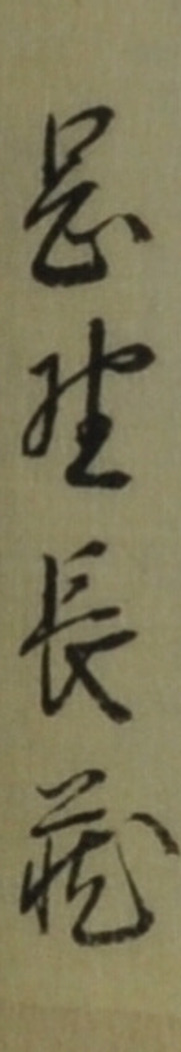岡野長蔵
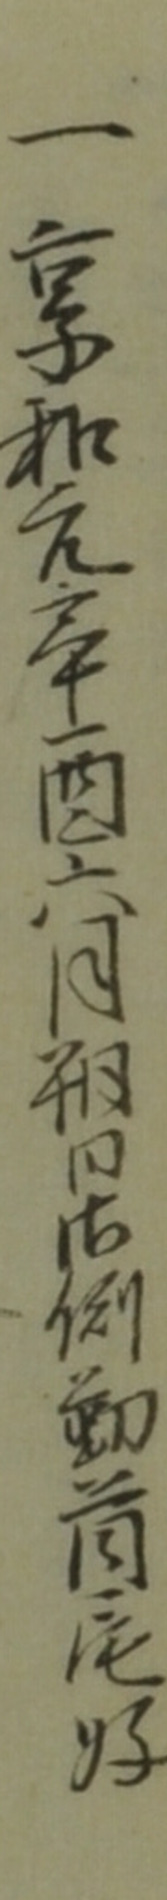一享和元辛酉六月朔日御側勤首尾好
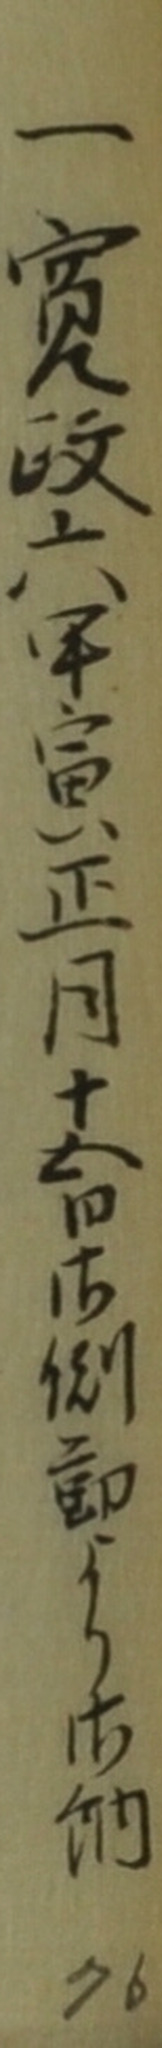一寛政六甲寅正月十五日御側勤より御納
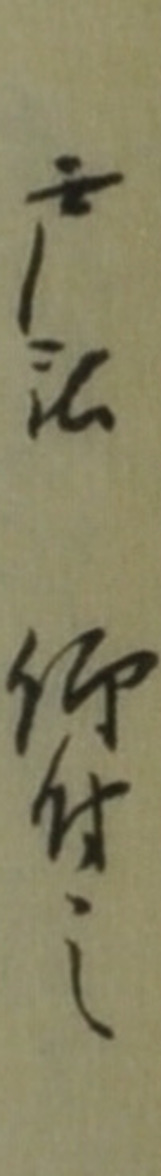戸被仰付之
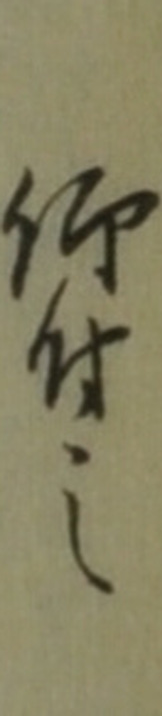仰付之
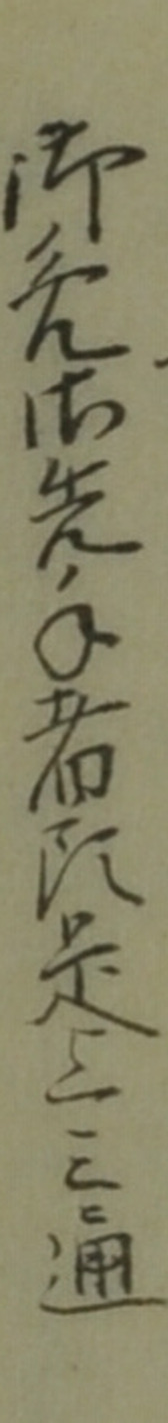御免御先手者頭是迄之通
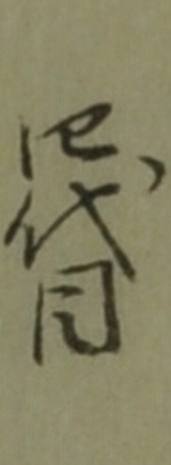四代目
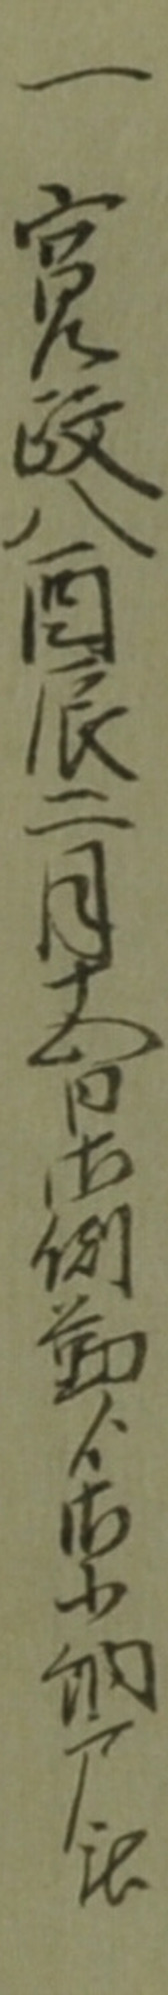一寛政八丙辰二月十五日御側勤ゟ御小納戸被
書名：諸御役代々録（四）
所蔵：伊那市立高遠町図書館・合同会社AMANE
